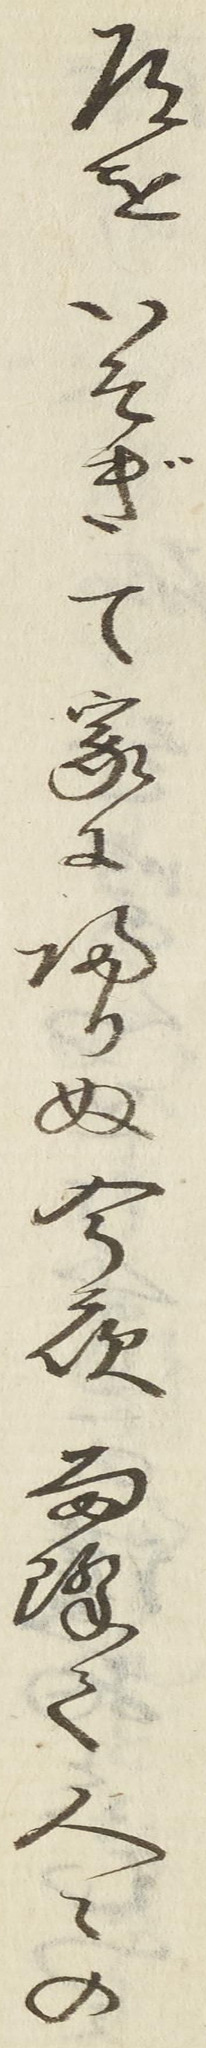道をいそぎて家に帰りぬ今夜雨降て人〻の
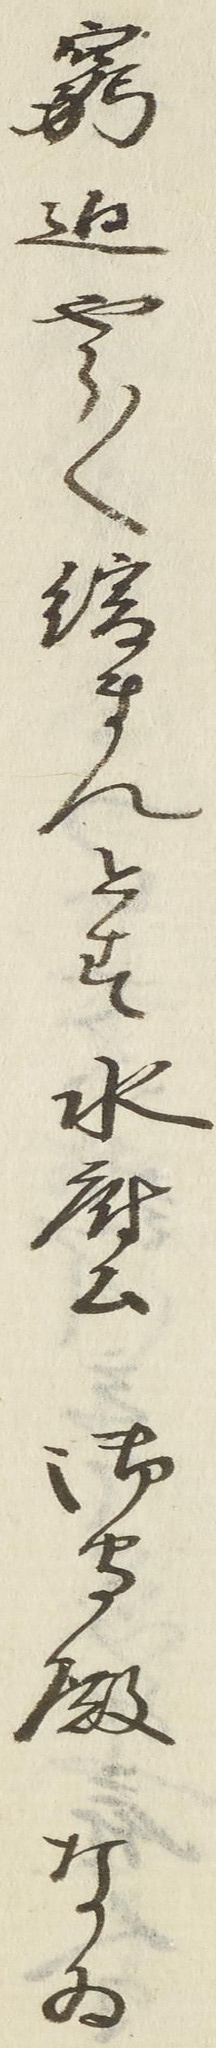窮迫やう〳〵緩まんとす水府公御守殿なゐ
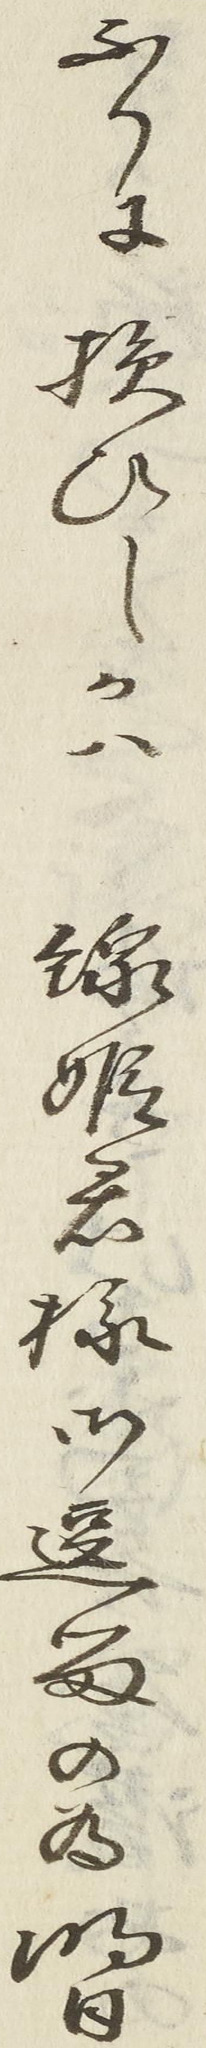ふりに損ひしかは線姫君様御逗留の為明日
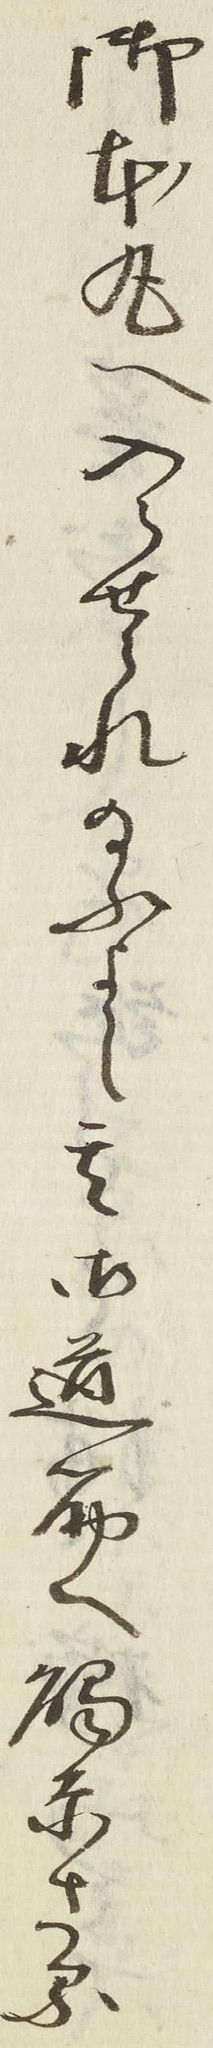御本丸へ入らせられ給ふよし其御道筋へ觸示さる
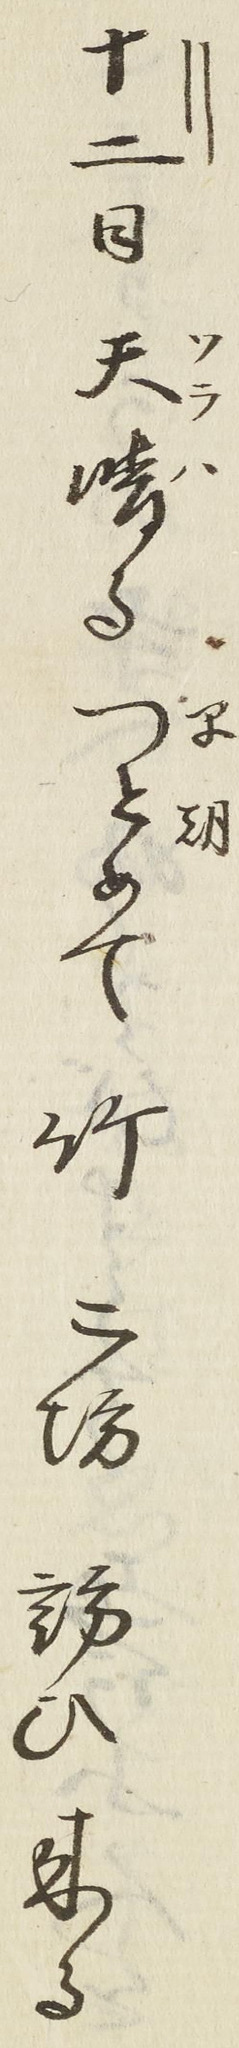十二日天晴るつとめ早朝て竹こ坊訪ひ来る
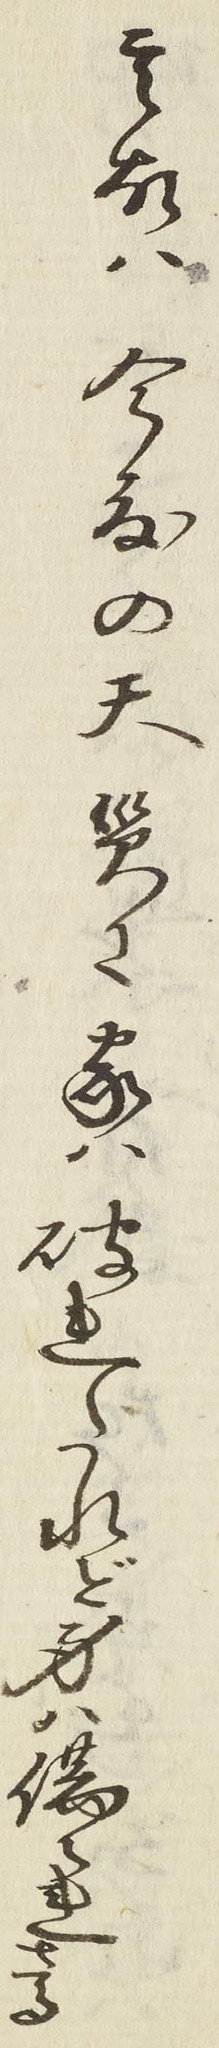其故は今度の天災に家は破れたれど身は傷られさる
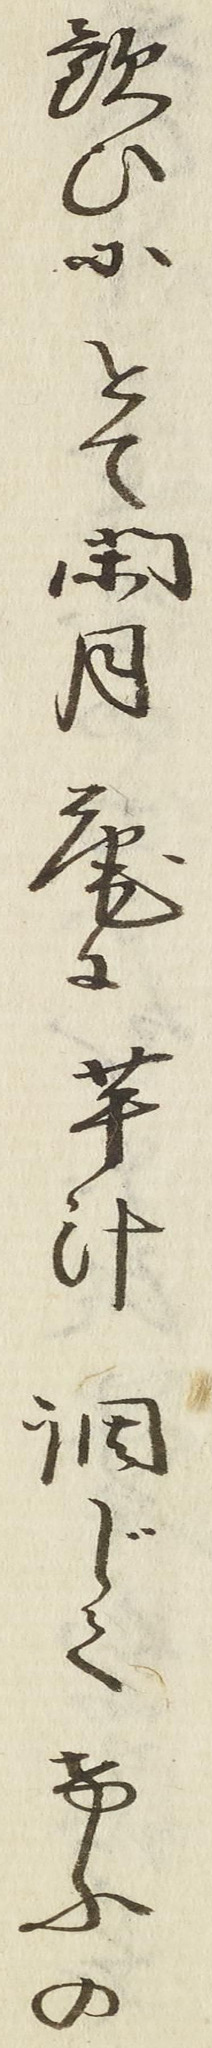歓ひにとて閑月庵に芋汁調じてけふの
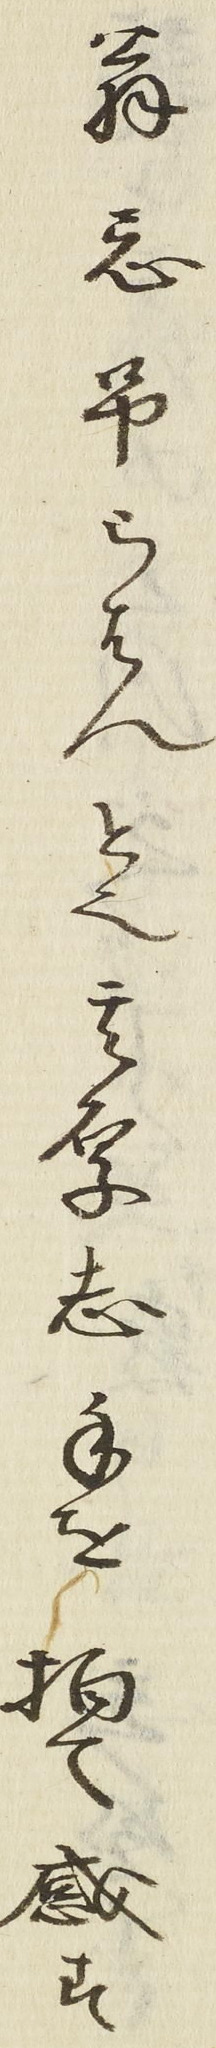翁忌弔らはんと也其厚志手を拍て感す
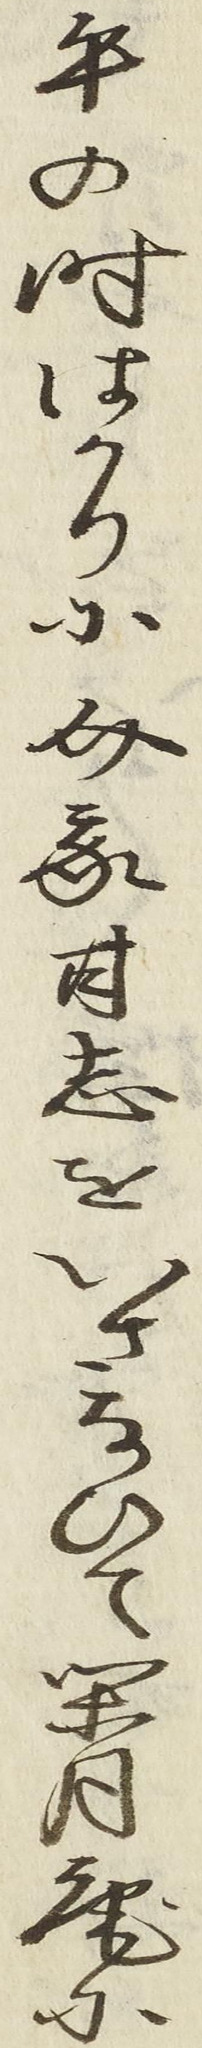午の時はかりに介家甘志をいさなひて閑月庵に
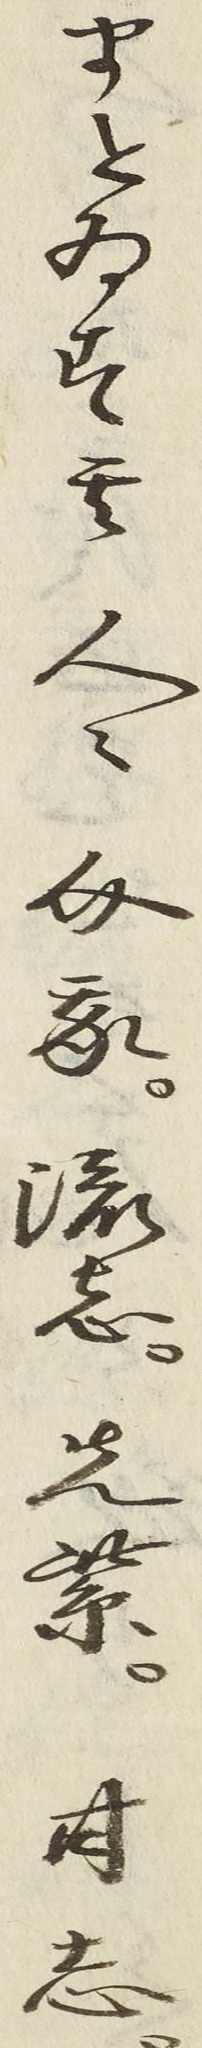まとゐす其人〻介家。流志。先紫。甘志。
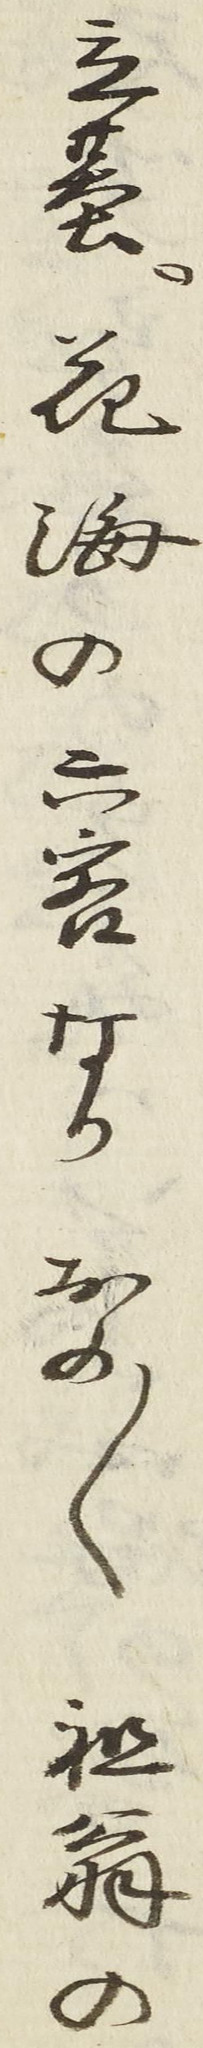立基。花海の六客なりおの〳〵祖翁の
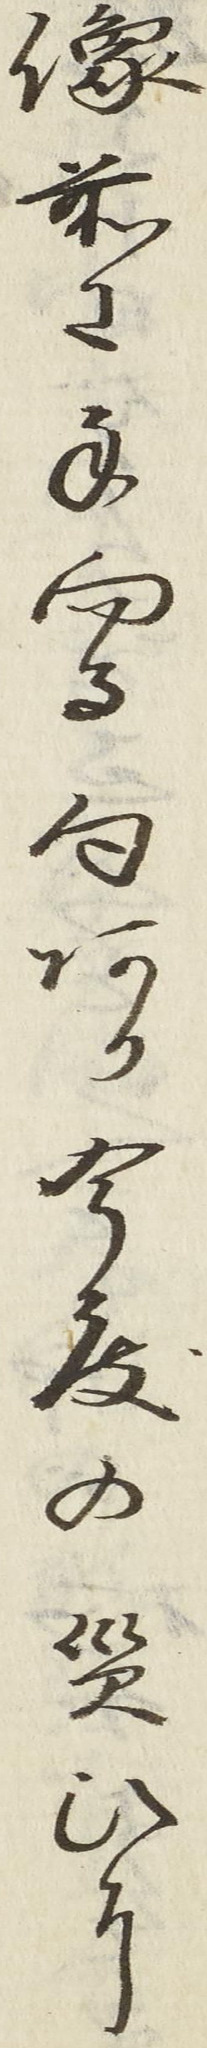像前に手向る句あり今度の災ひに
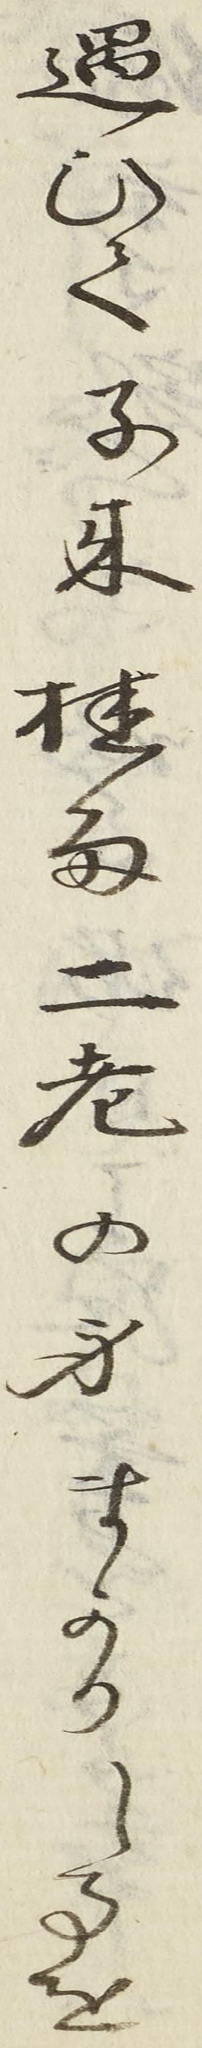遭ひて子来桂雨二老の身まかりし事を
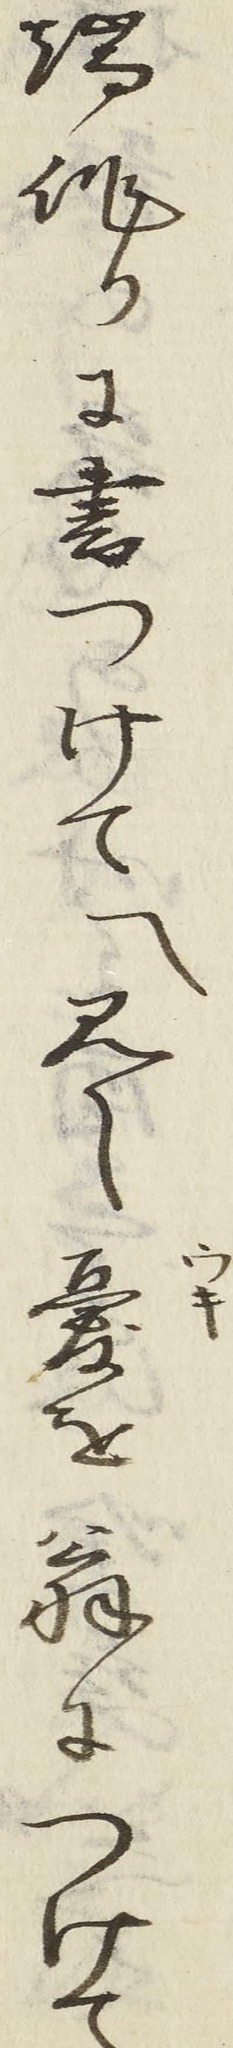端作りに書つけて〽見し憂を翁につけて
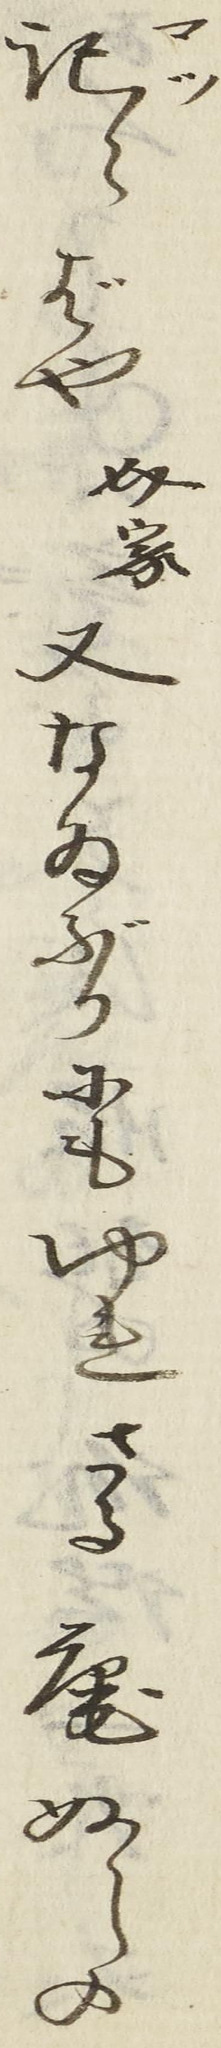祀らずや介家又なゐぶりにもゆれさる庵ぬしの
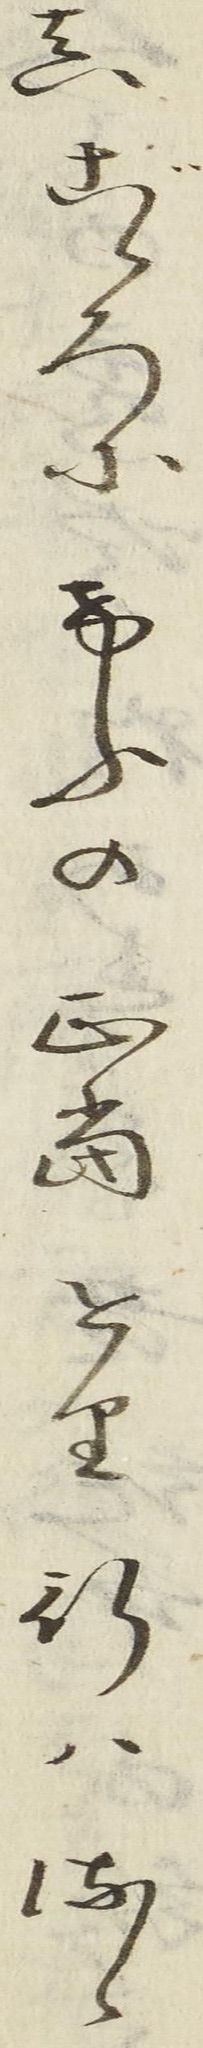真ごゝろにけふの正当とり行はるゝ
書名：やぶれ窓の記　全
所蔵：東京大学地震研究所図書室 Earthquake Research Institute Library, The University of Tokyo, JAPAN
